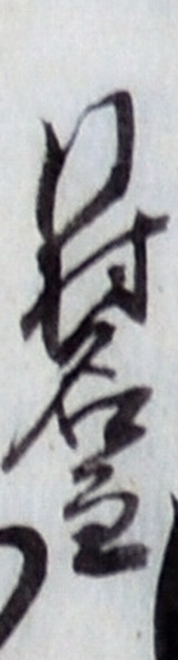同村名主
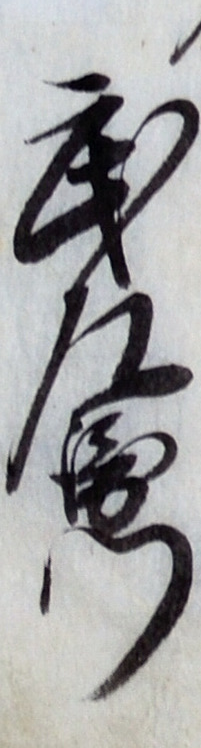武左衛門
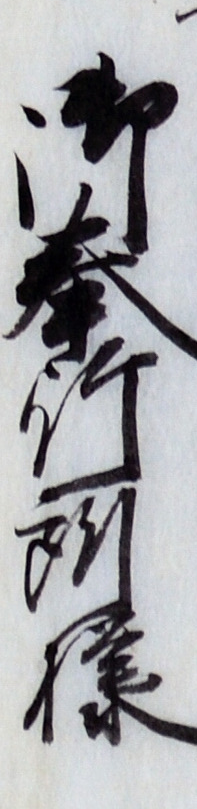御奉行所様

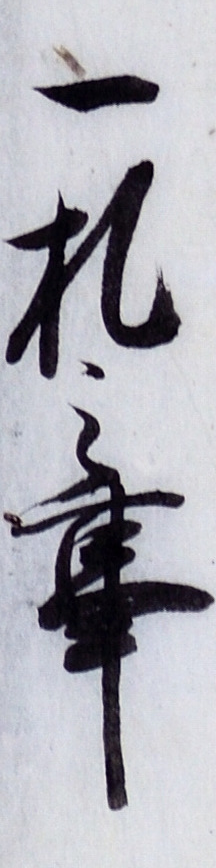一札之事
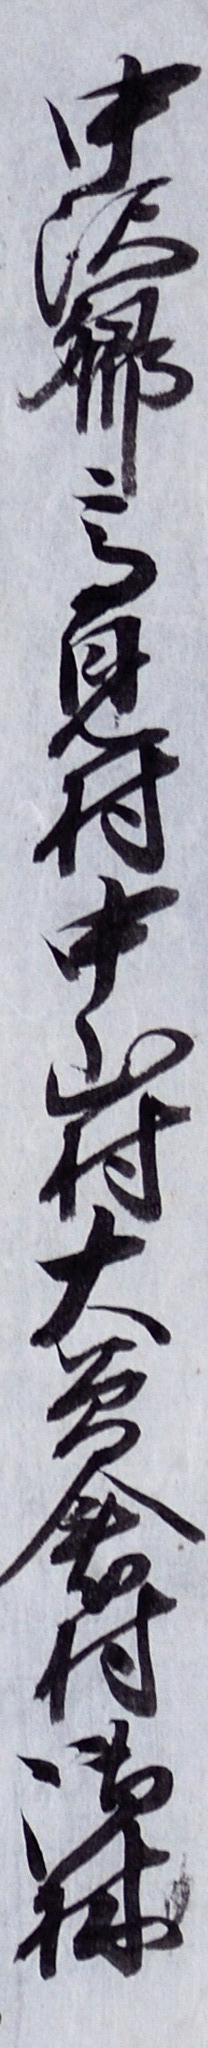中沢郷高見村中山村大曽倉村御林
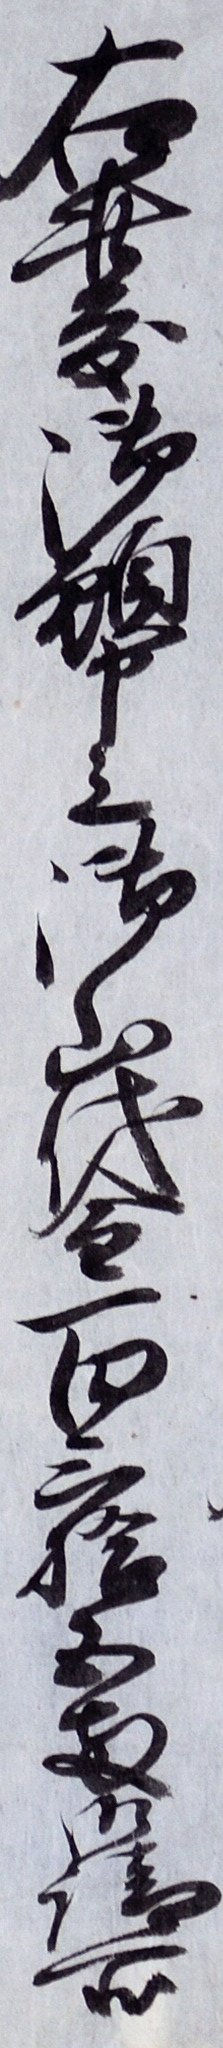右此度御願申上御山代金百三拾五両御請所
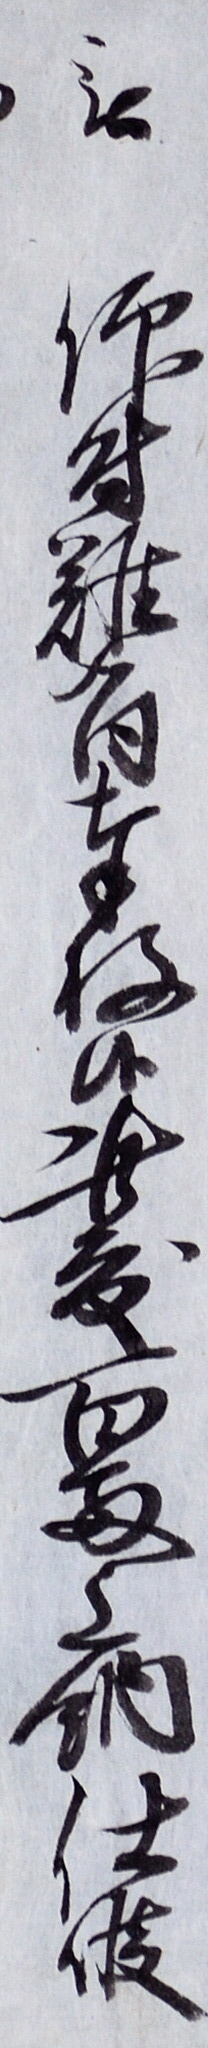被仰付難有奉存候此度百両上納仕候
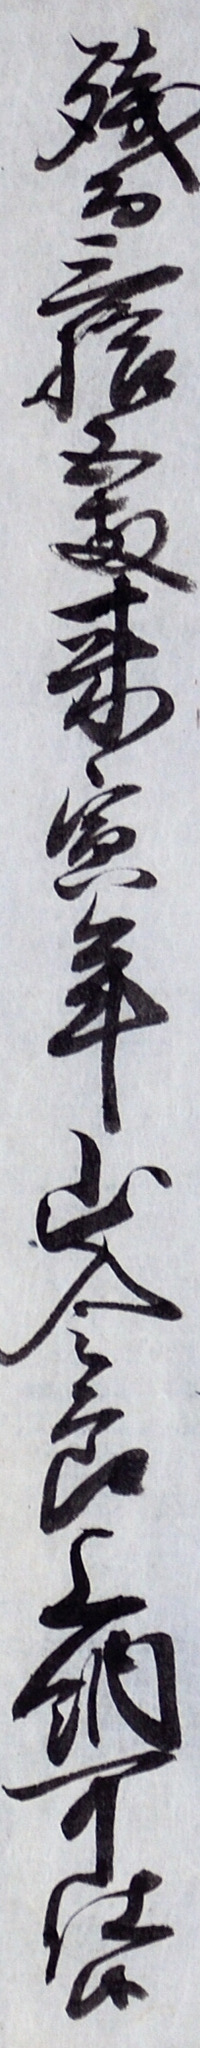残る三拾五両来寅年山入之節上納可仕候
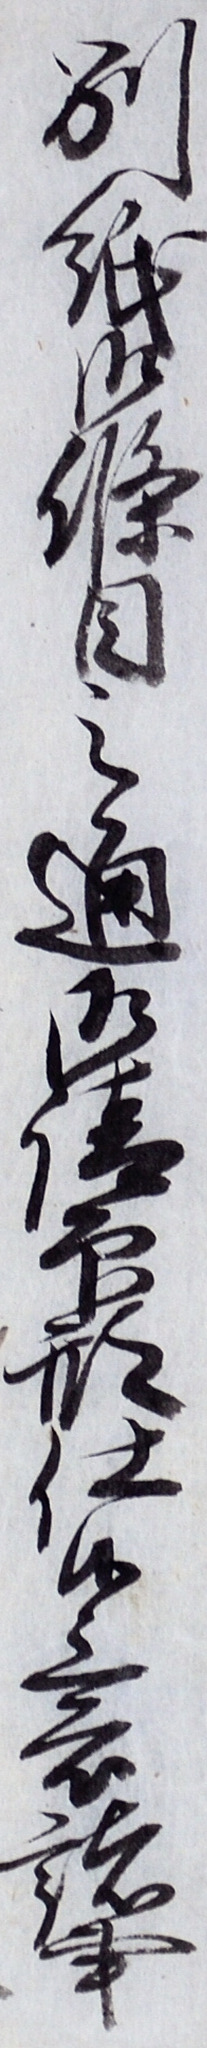別紙御條目之通御請印形仕候上者諸事
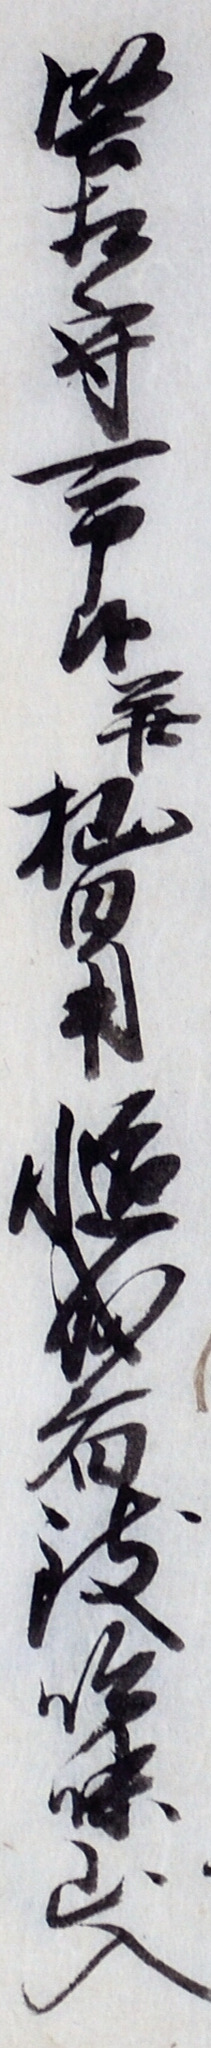堅相守可申候幷杣日用慥成者致吟味山入
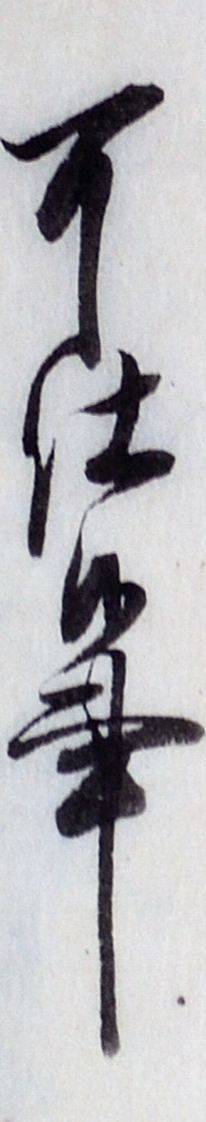可仕候事
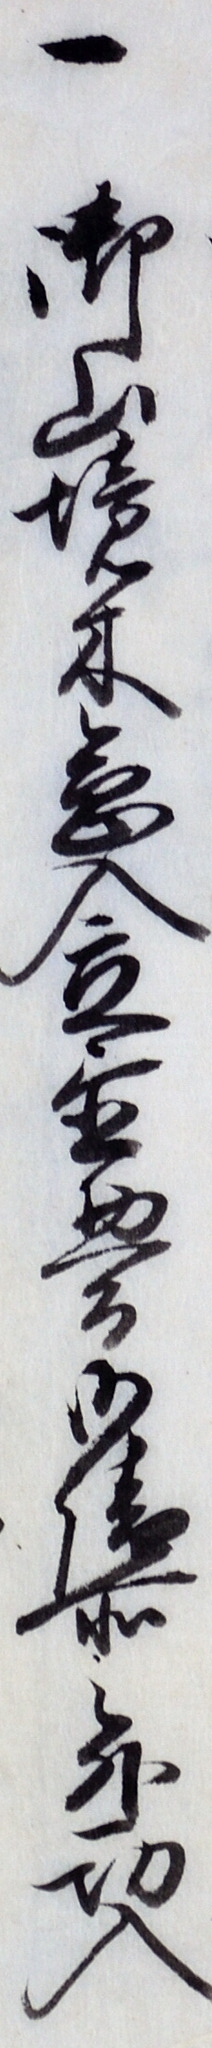一御山境木念入立置惣而御請所之外一切入
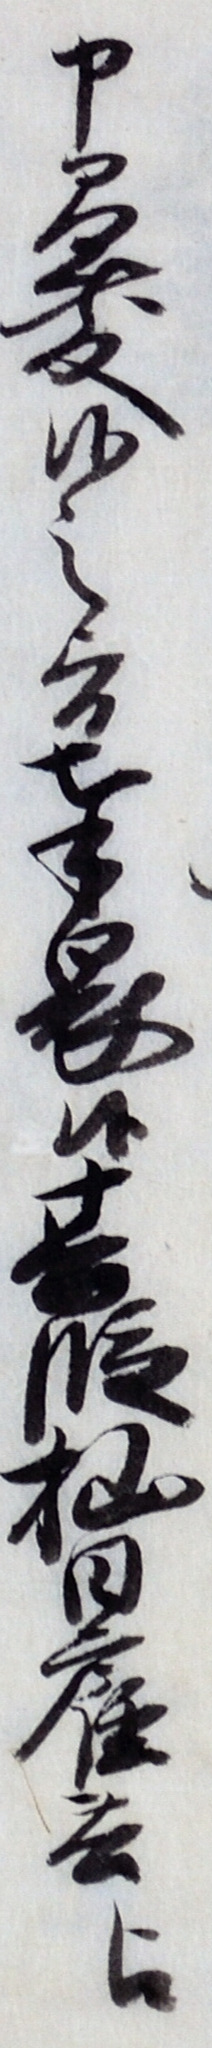申間敷候之旨奉畏候其段杣日雇共江
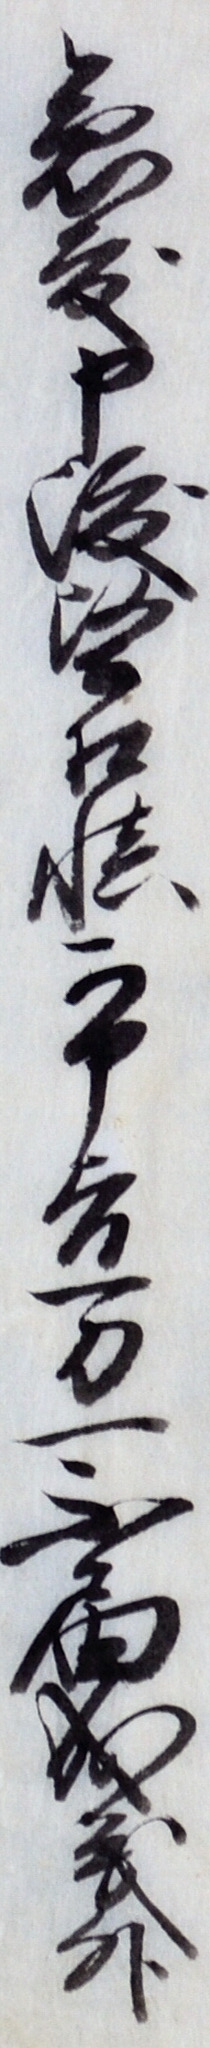急度申渡堅相慎可申旨万一不届成義外
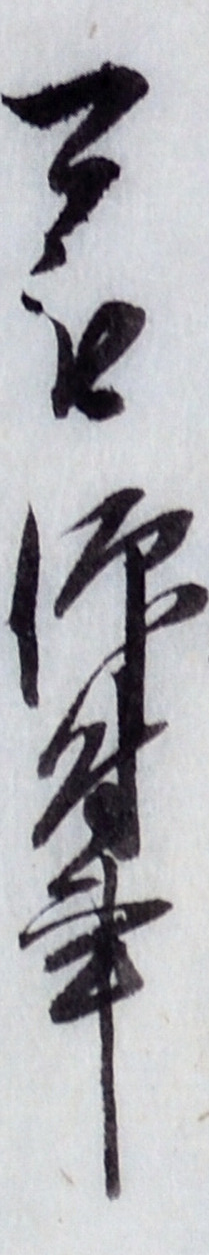可被仰付事
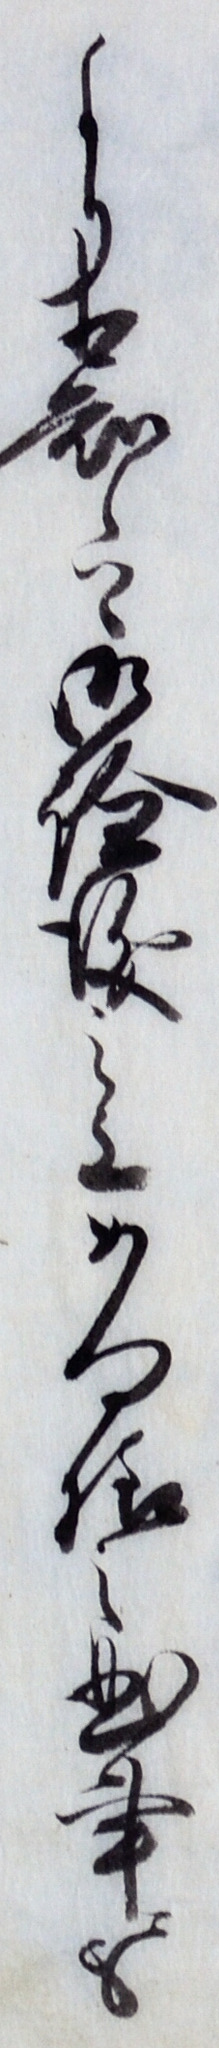より相知候ハヽ御詮儀之上如何様之曲事ニも
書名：御持山御払掟書願書控
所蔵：伊那市立高遠町図書館・合同会社AMANE
